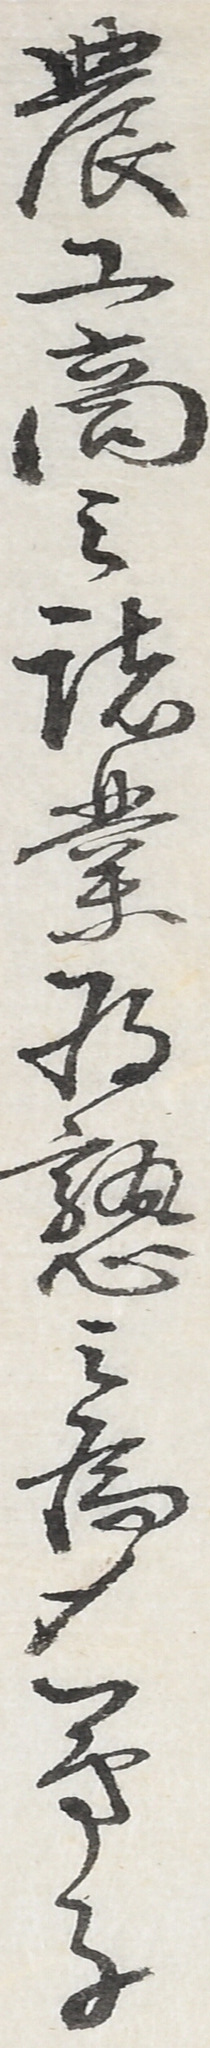農工商之諸業為熟之為メ弟子
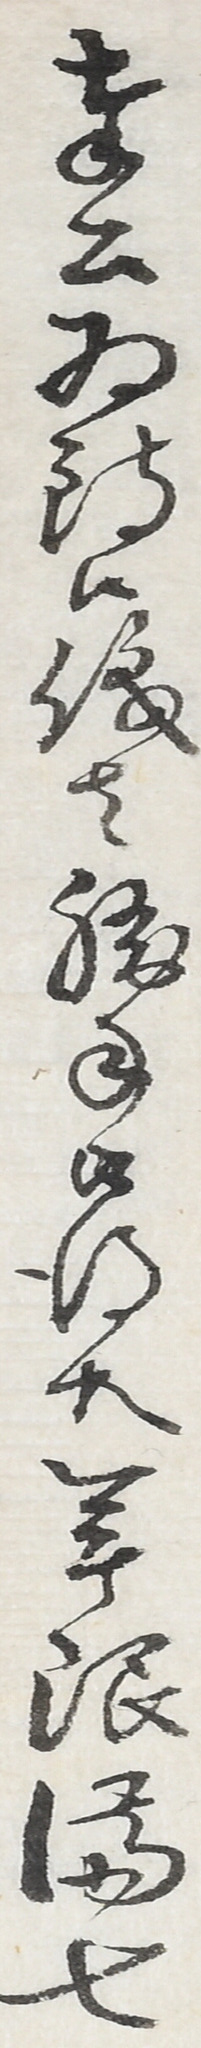奉公為致候義は勝手被得共年限満七
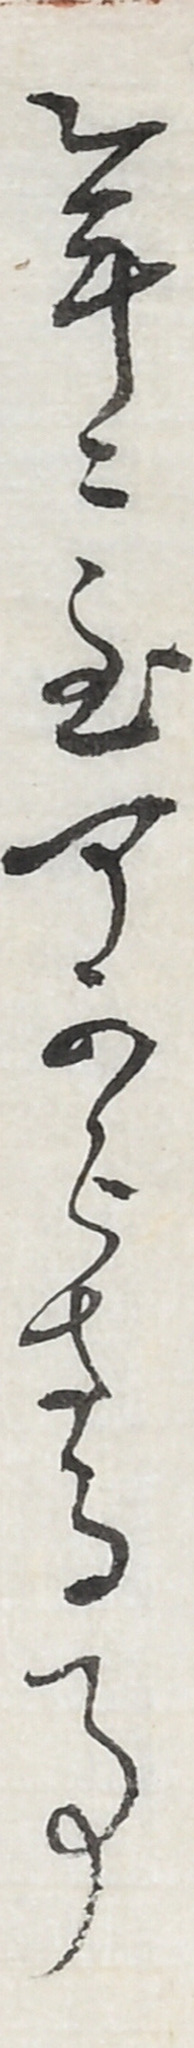年ニ至可からさる事
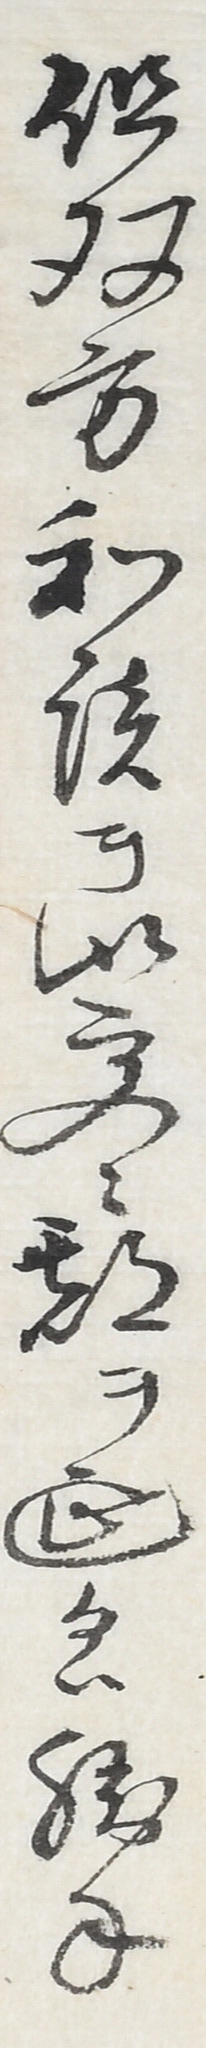但双方和談ヲ以更ニ期ヲ延事ハ勝手
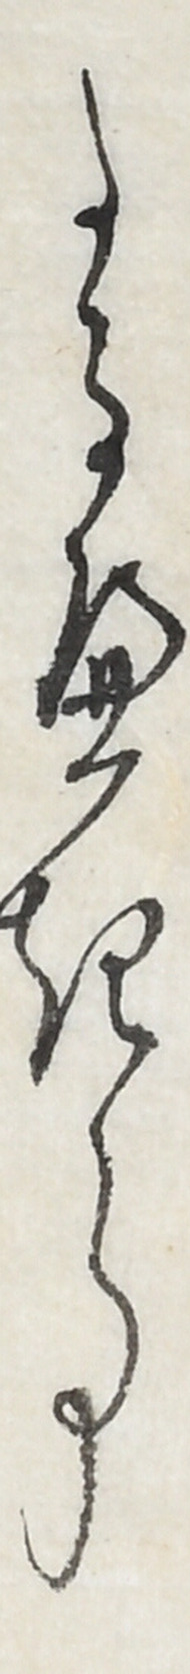たるへき事
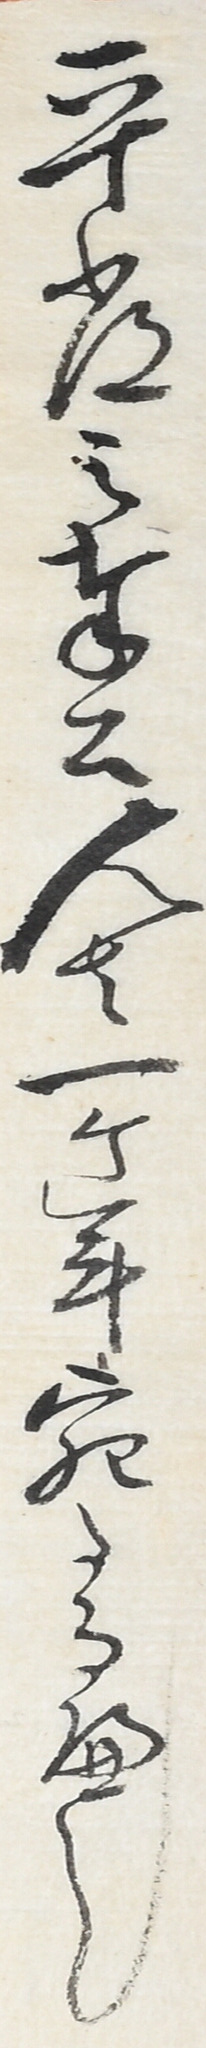平常之奉公人は一ケ年宛たるへし

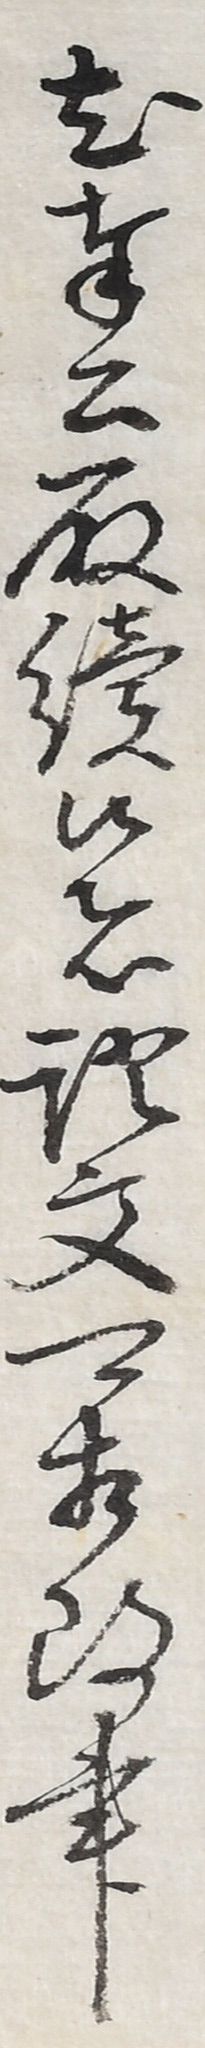尤奉公取続候者証文可相改事
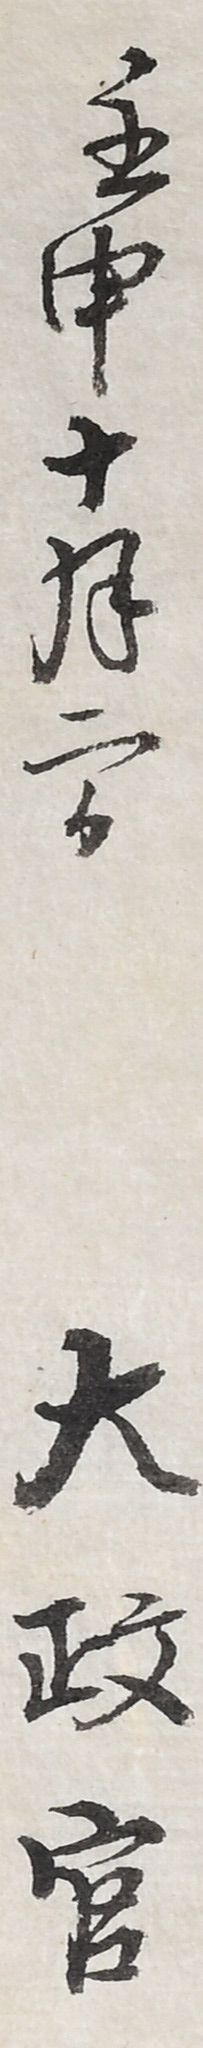壬申十月二日大政官
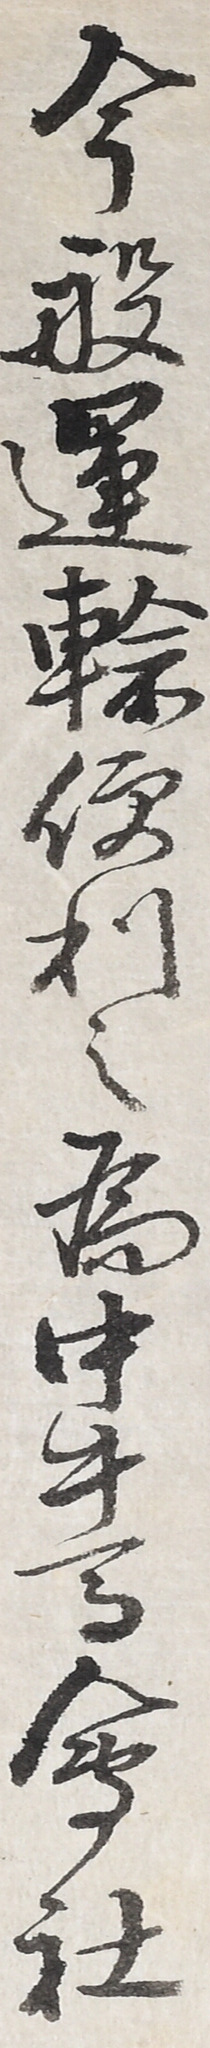今般運輸便利之為中牛馬会社
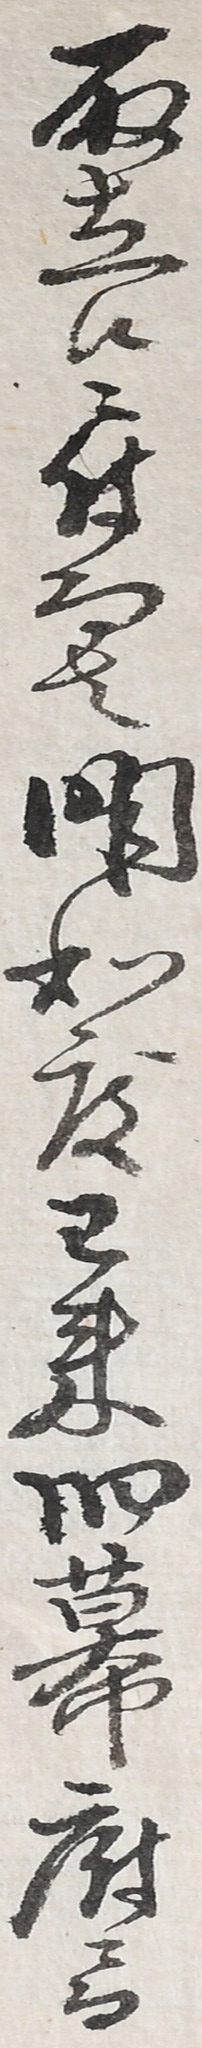取立候ニ付而は明和度已来旧幕府ニ而
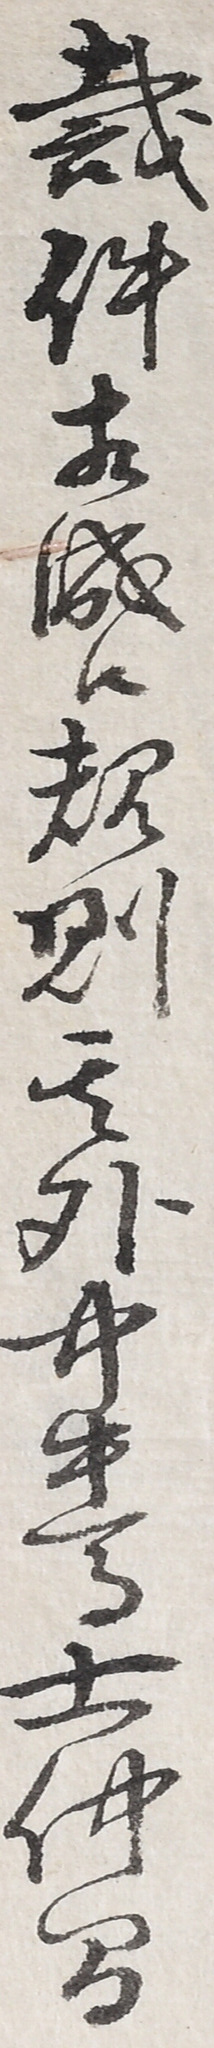裁件相成候規則其外中牛馬士仲間
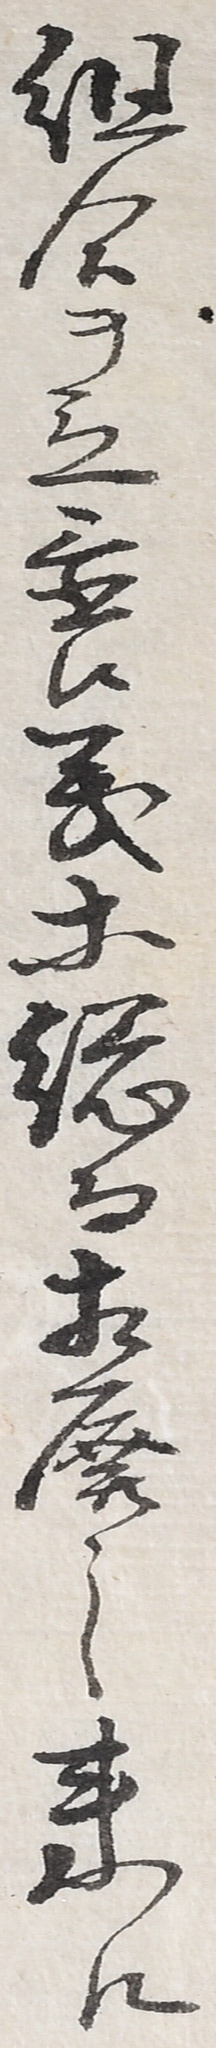組合ヲ立置候義等総而相廃し来ル
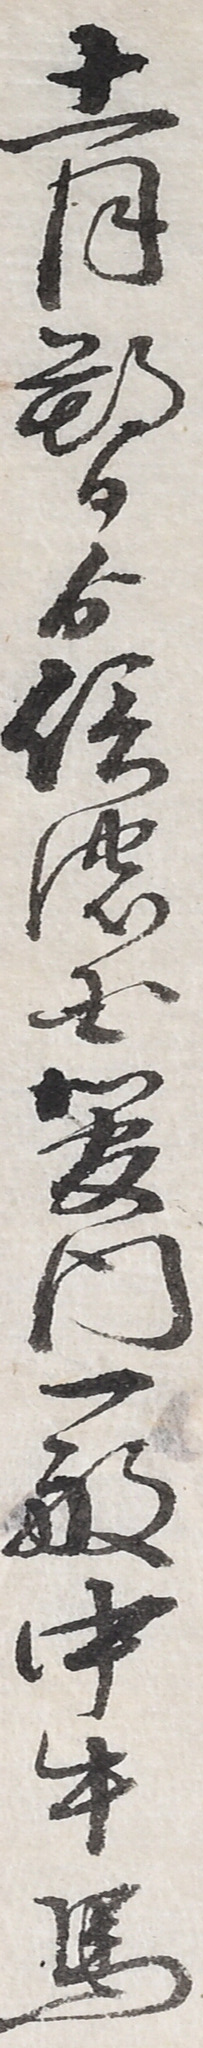十一月朔日ゟ信濃国管内一般中牛馬
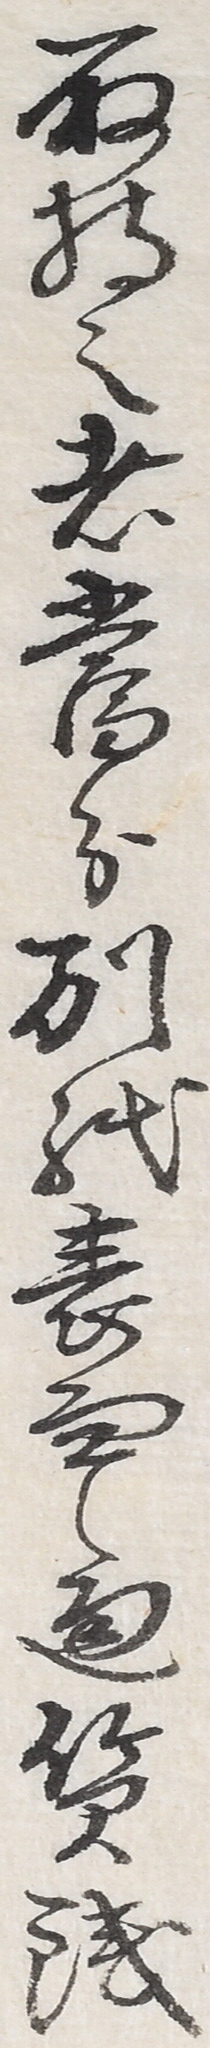取持之者当分別紙表面之通賃銭
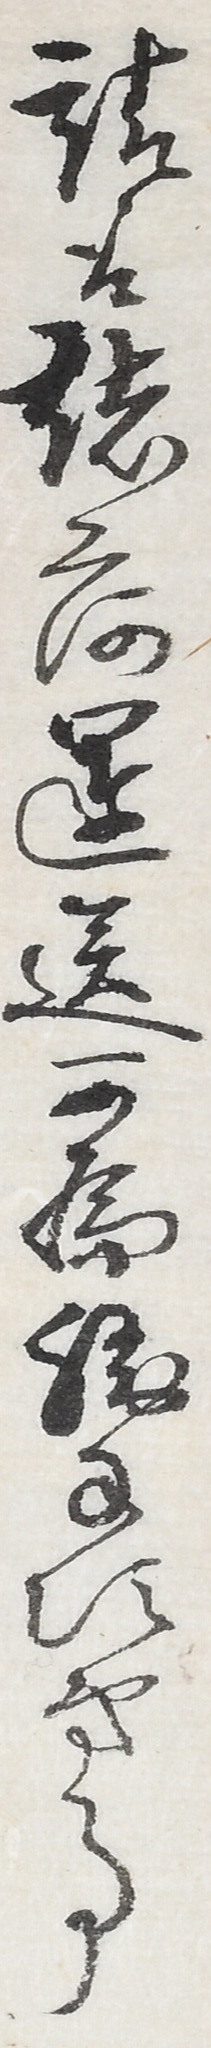請取諸荷運送可為勝手次第事
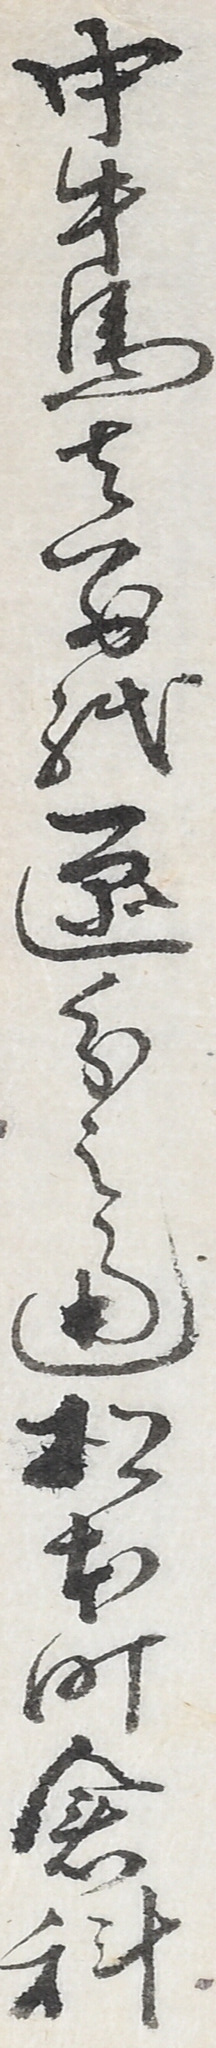中牛馬は別紙区分之通松本町倉科
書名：壹番・御布告一式
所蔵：伊那市立高遠町図書館・合同会社AMANE
